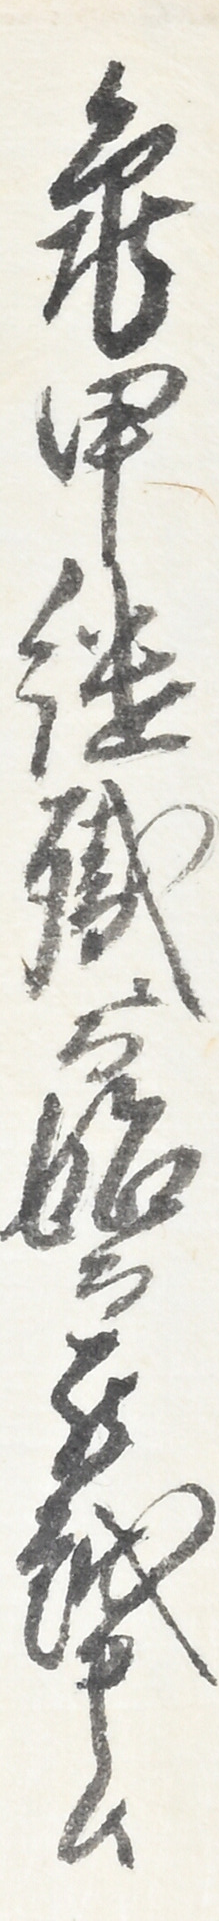亀甲継職ニ而始而罷越申候
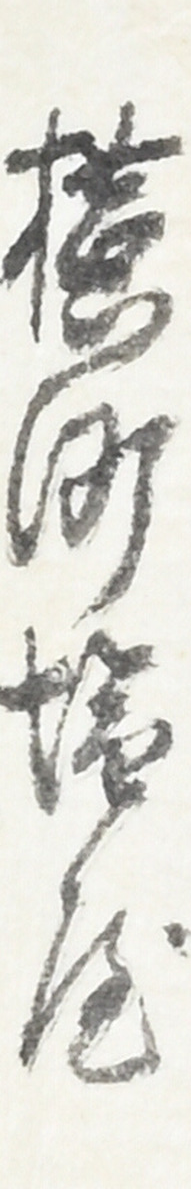横町塩屋
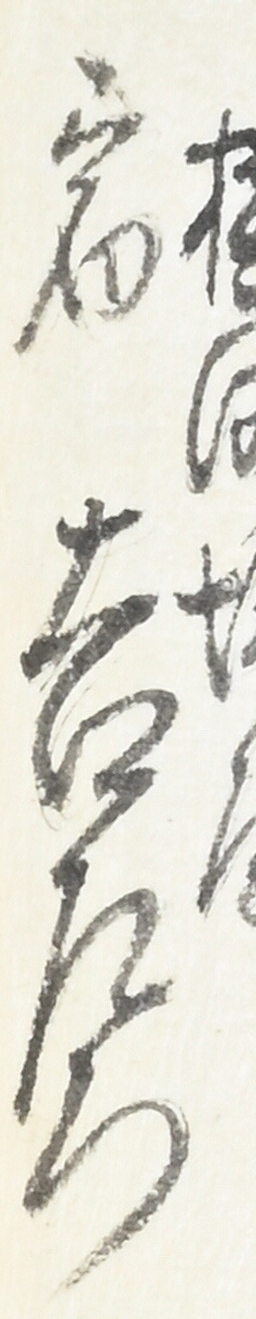宿吉左衛門
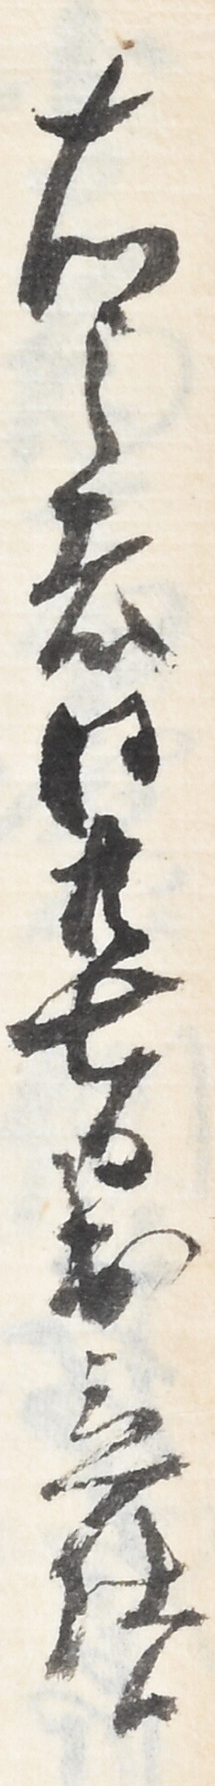右之者同十五日出立仕候
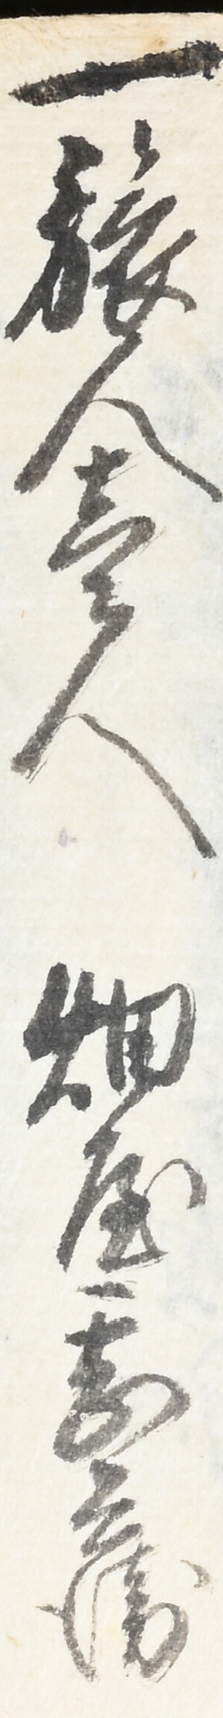一旅人壱人菱屋惣兵衛

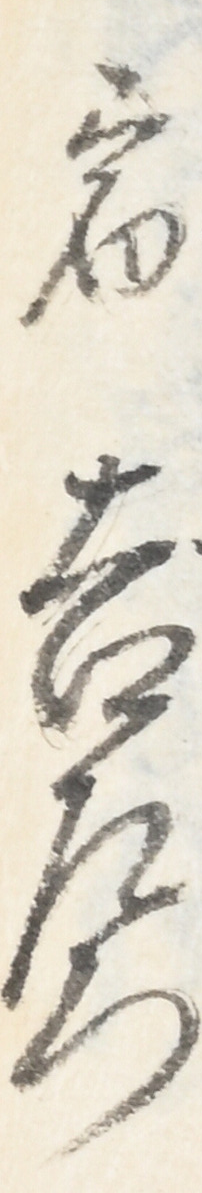宿常右衛門
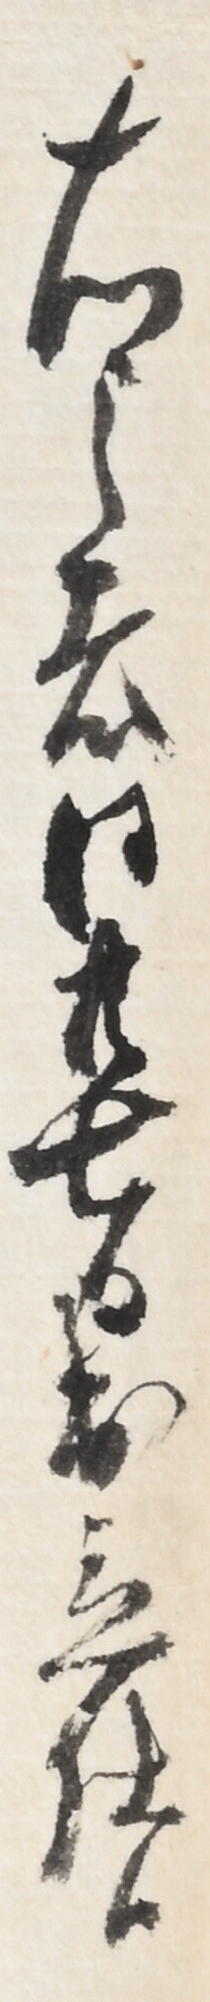右之者同廿七日出立仕候
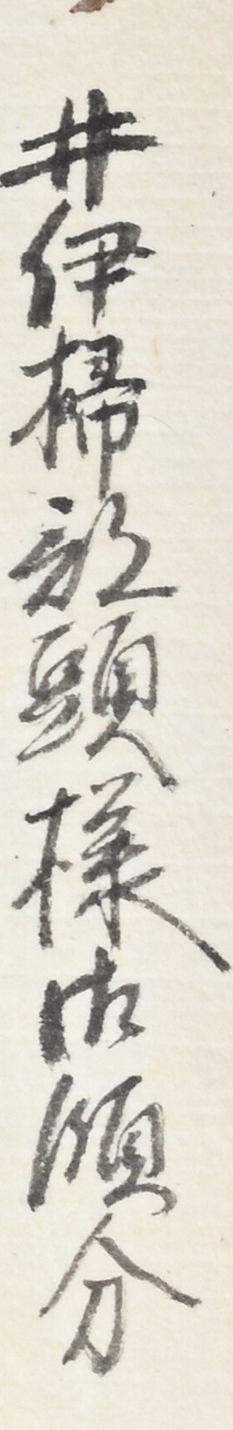井伊掃部頭様御領分
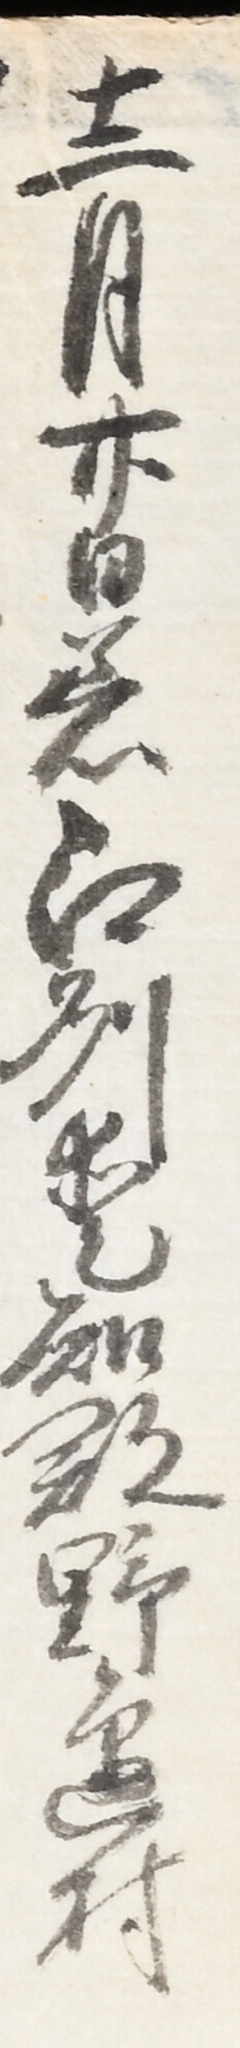十二月廿日着江州愛知郡野辺村
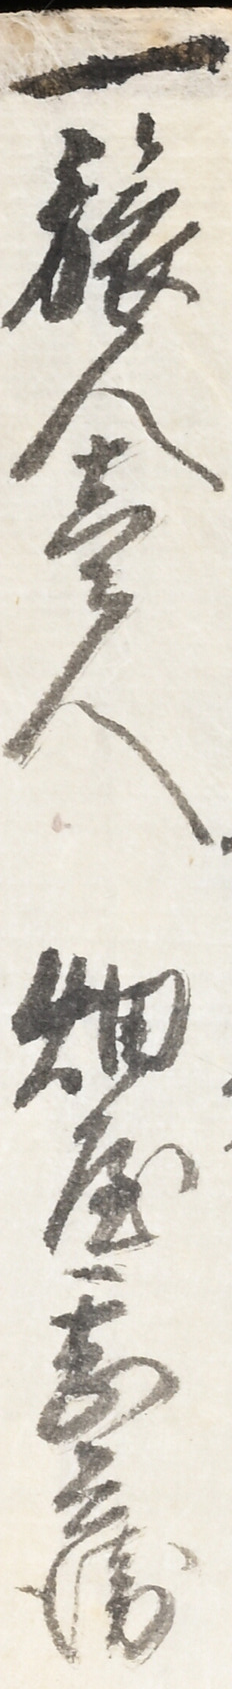一旅人壱人畑屋甚兵衛
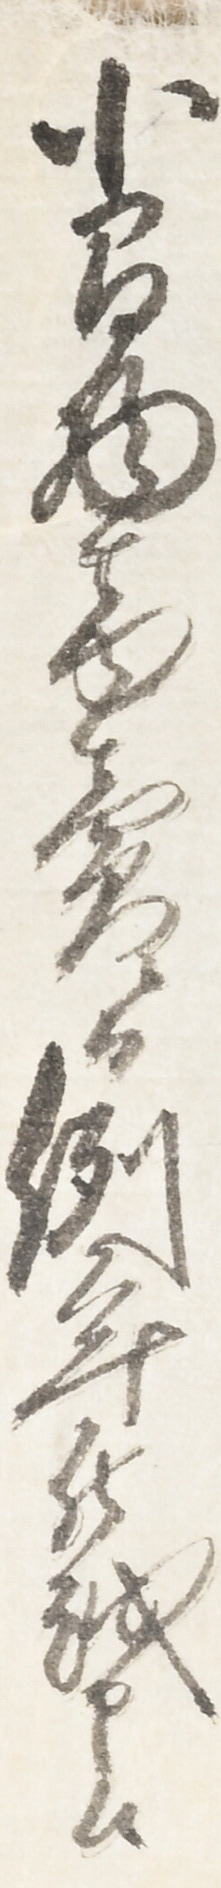小間物商売ニ而例年罷越申候
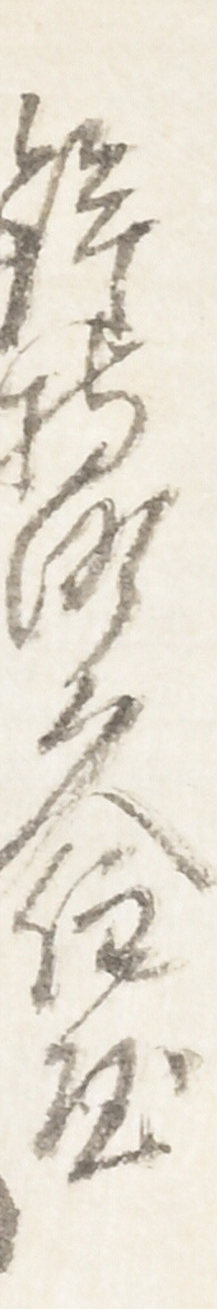鉾持町久住屋
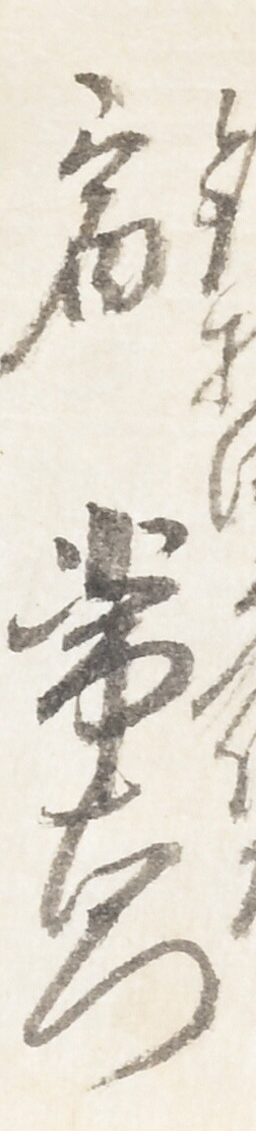宿常右衛門
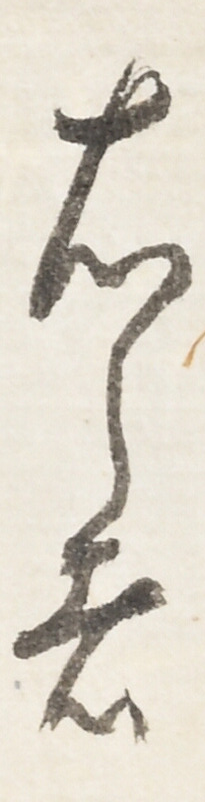右之者
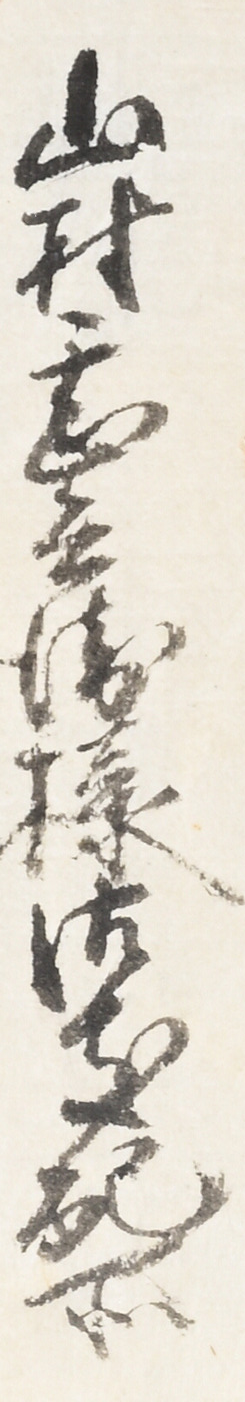山村甚兵衛様御支配所
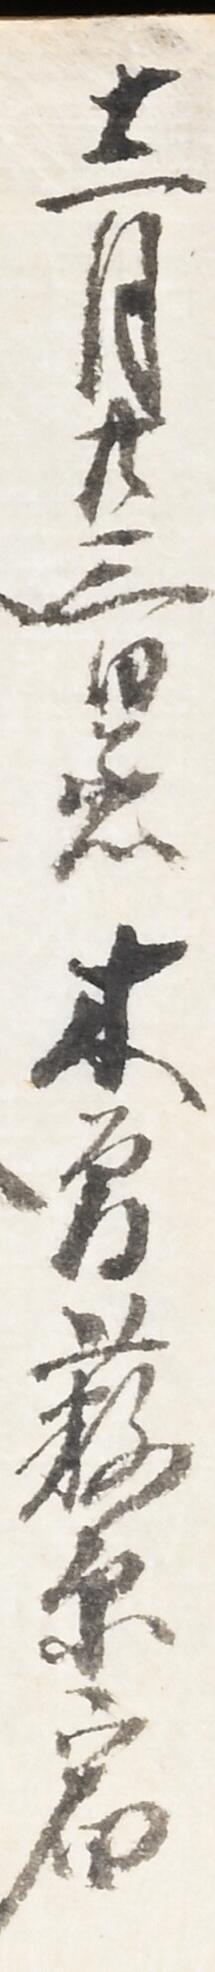十二月廿三日着木曾藪原宿
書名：旅人泊控帳
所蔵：伊那市立高遠町図書館・合同会社AMANE
